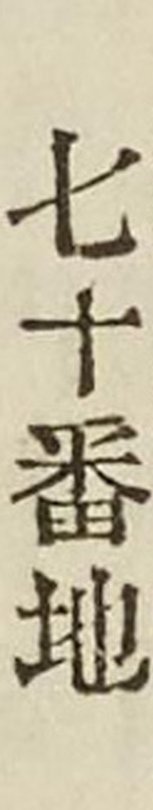七十番地
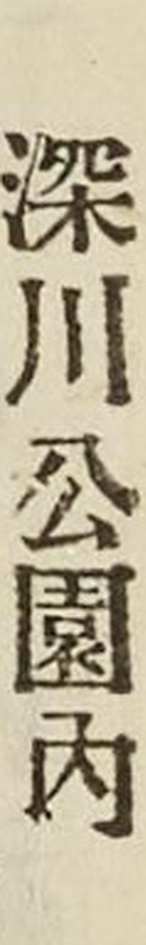深川公園内
